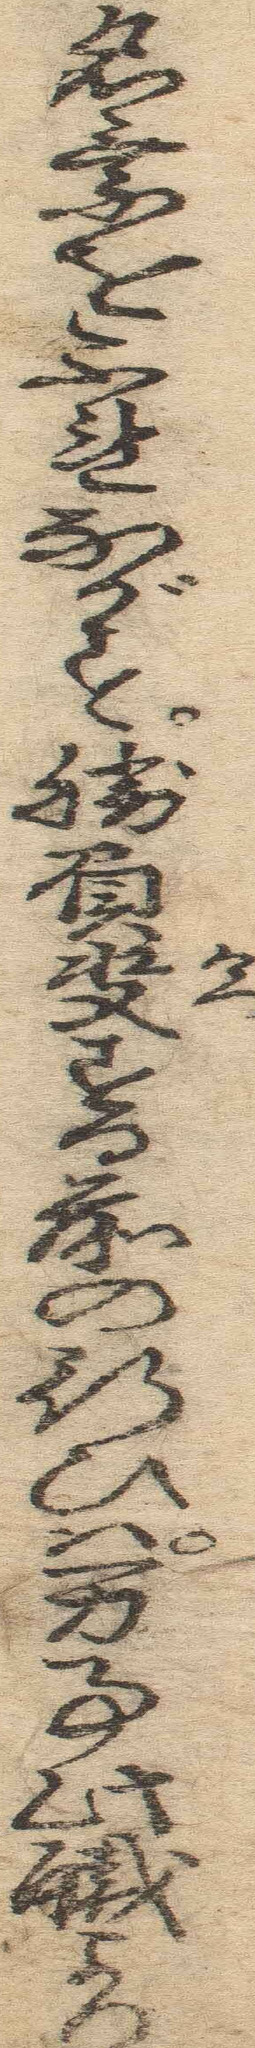名乗をふれながす。勝負決する前の行ひは。万事此職より
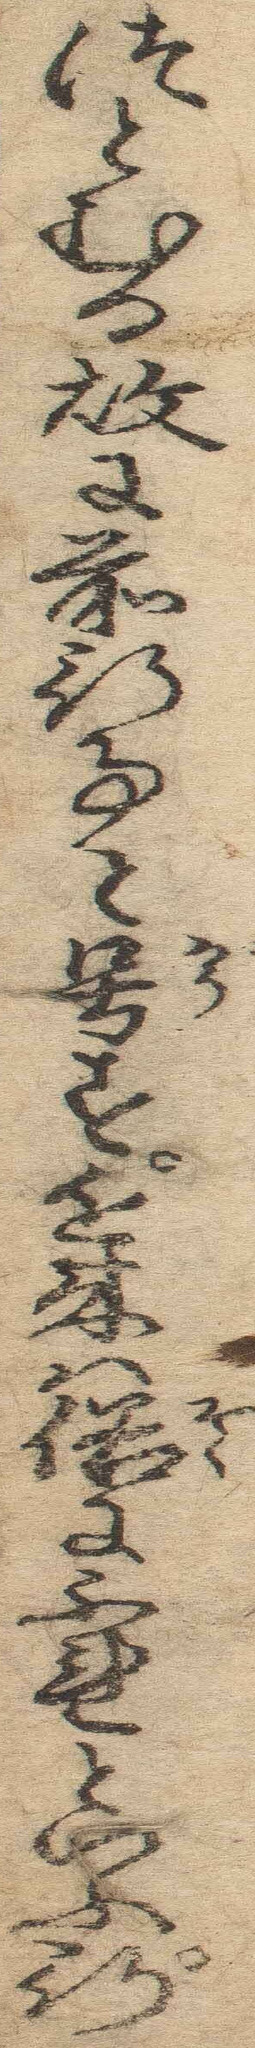つとむる故に前行事と号す。近年は俗にふれといふ。行

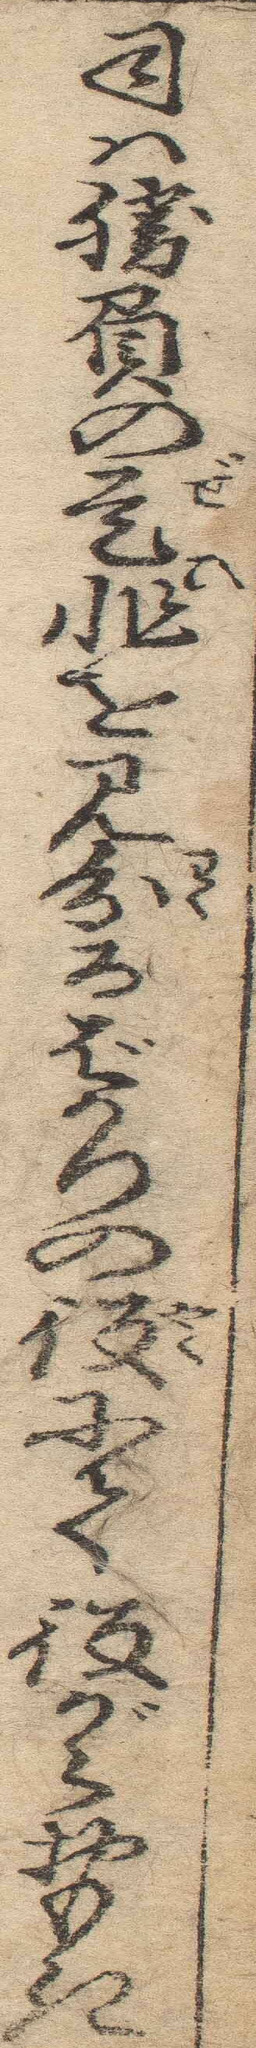司は勝負の是非を見分るばかりの役にて役がらおもき
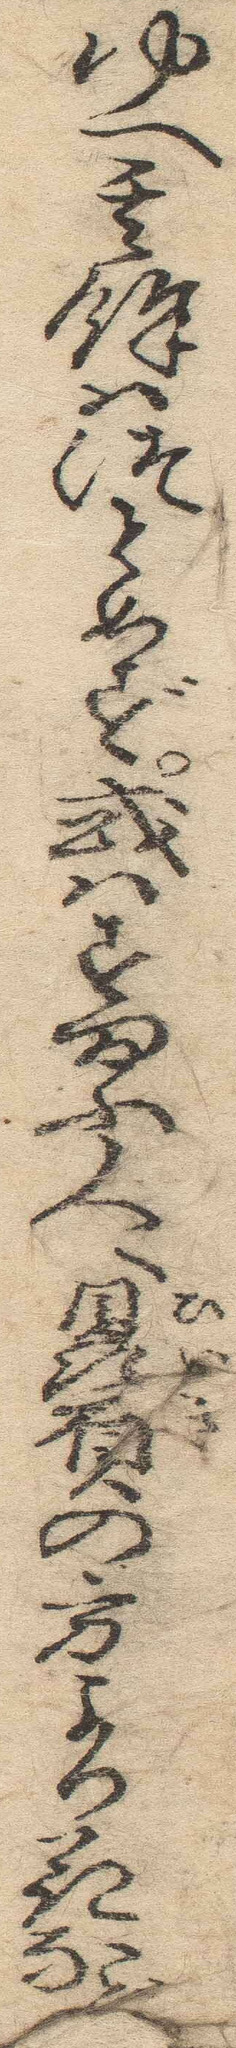ゆへ其餘はつとめず。或はすまふ人へ贔屓之方より花な
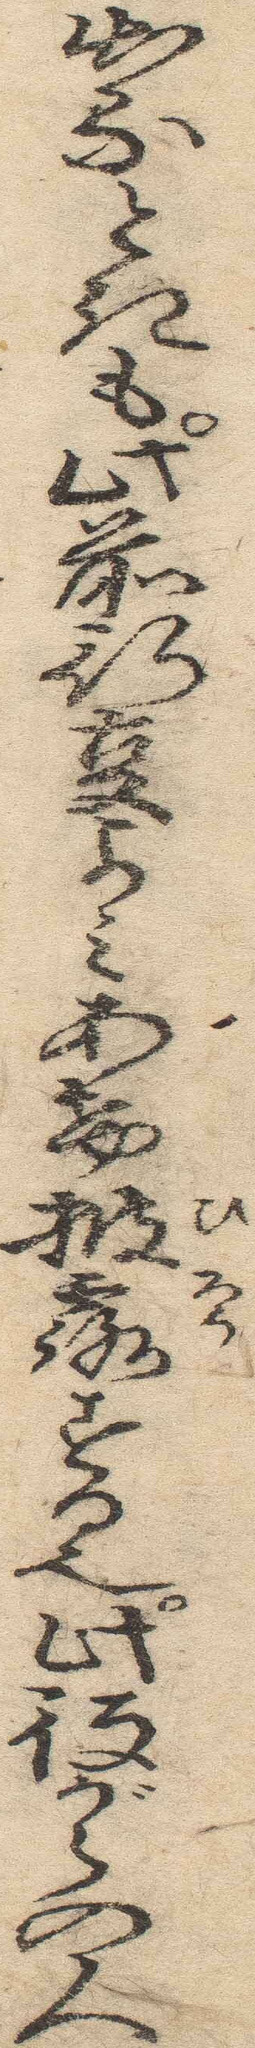出るときも。此の前行事よみあけ披露する也。此の役がらの人
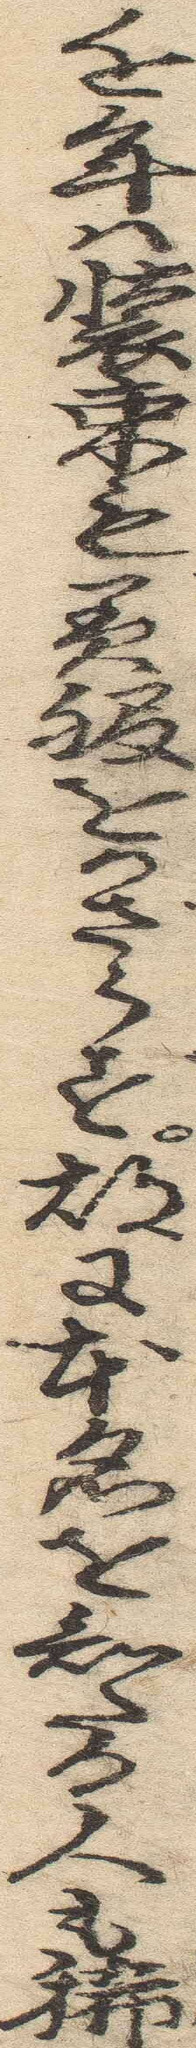近年は装束も美服をかざらず。故に本名を知たる人も稀
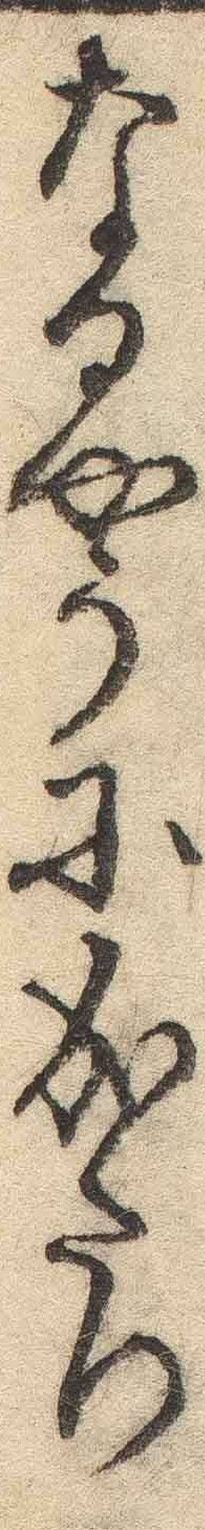なるやうに成たり
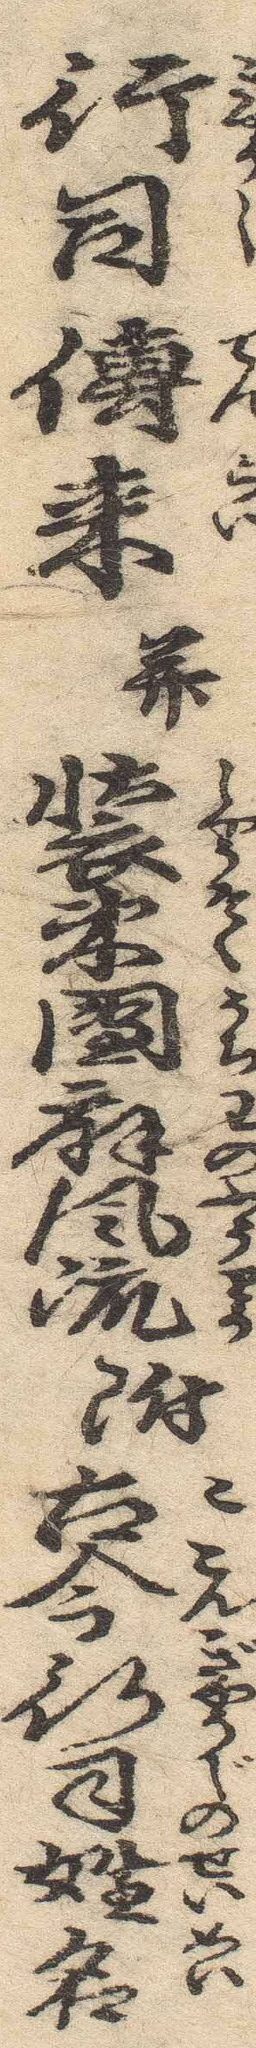行司伝来并装束団扇風流附古今行司姓名
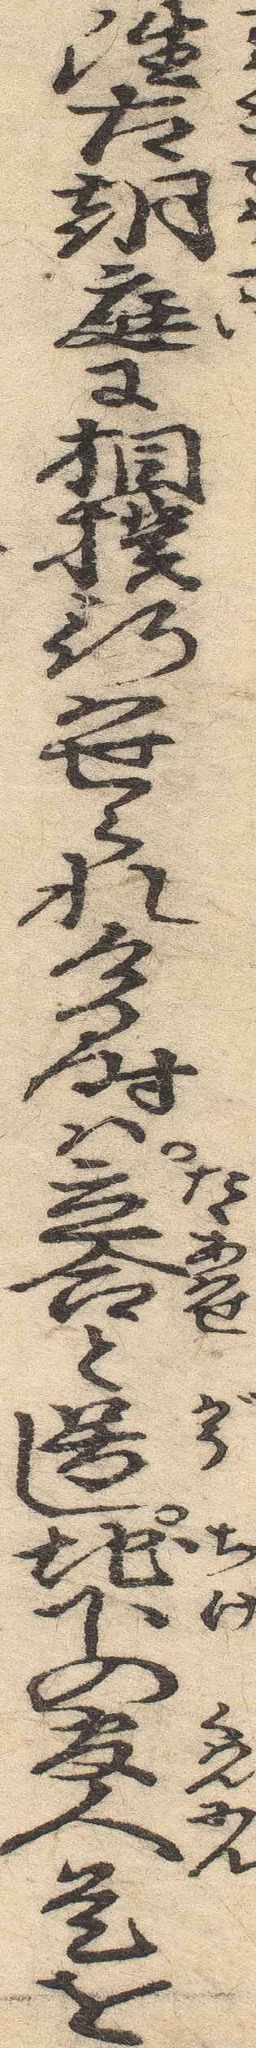往古朝庭に相撲行はせられける時は。立合と号し。地下の官人是を
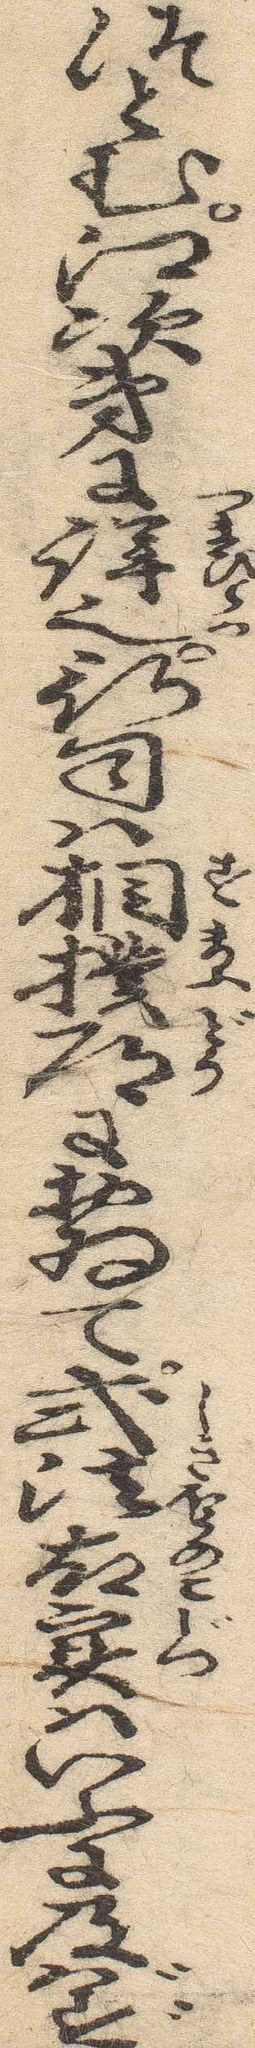つとむ。江次第に詳也。行司は相撲道におゐて。式法故実はいふに及ばず
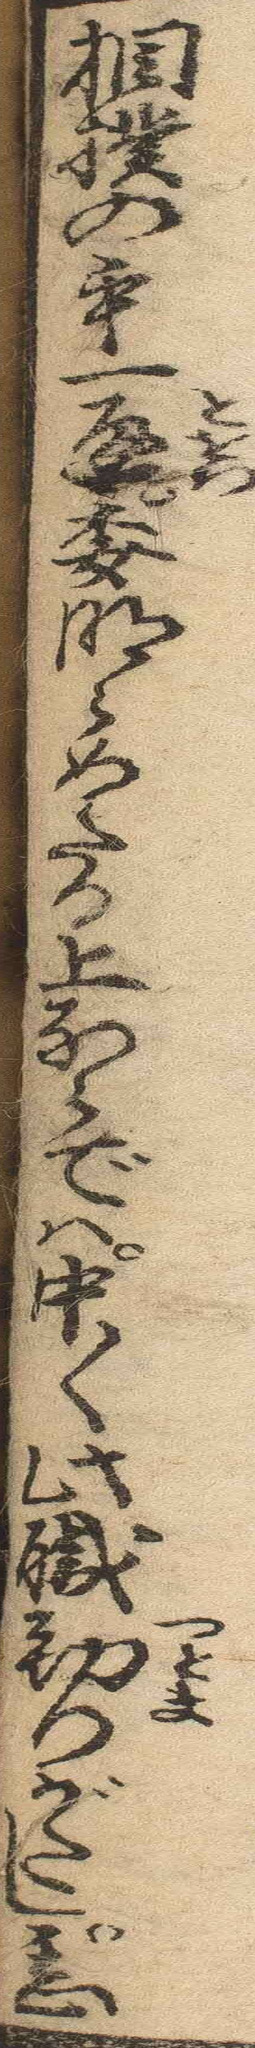相撲の事一通。委明らめたる上ならでは。中〳〵此職勤りがたし。甚
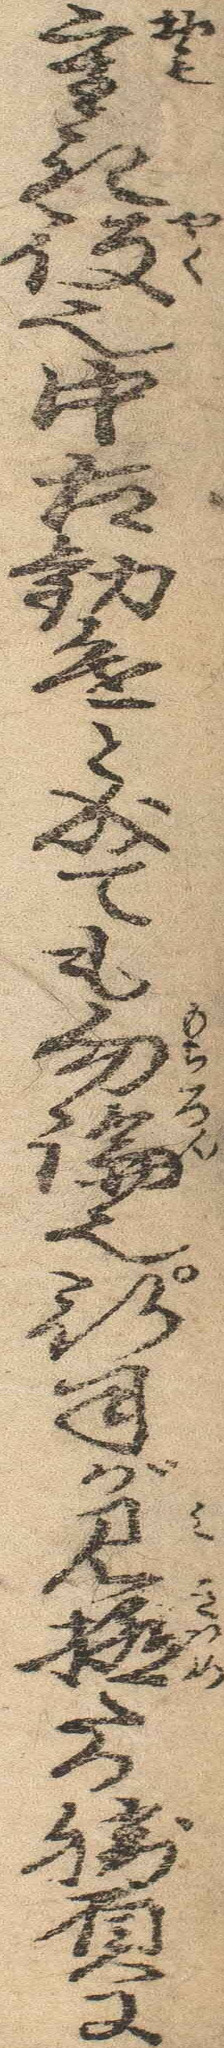重き役也中古勧進と成ても勿論也。行司が見極たる勝負に
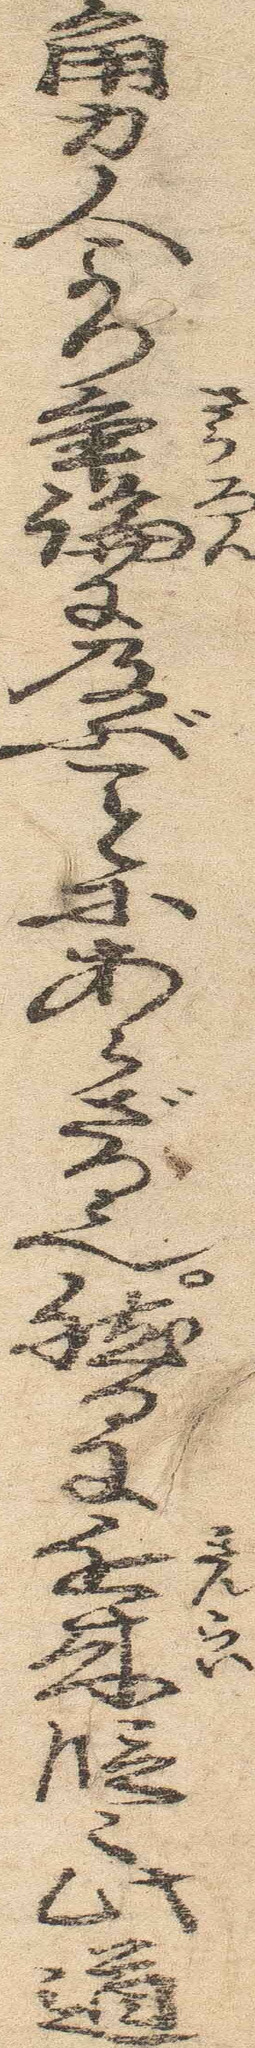角力人より争論に及ぶことにあらざる也。然るに近来段々此道
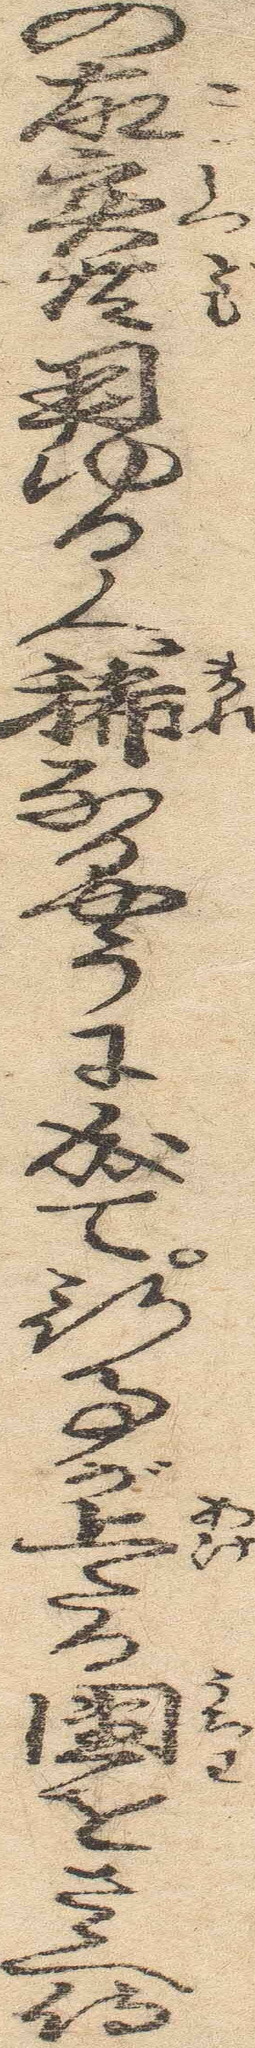の故実共用ゆる人稀なるやうに成て。行事が上たる団をさゝへ侍
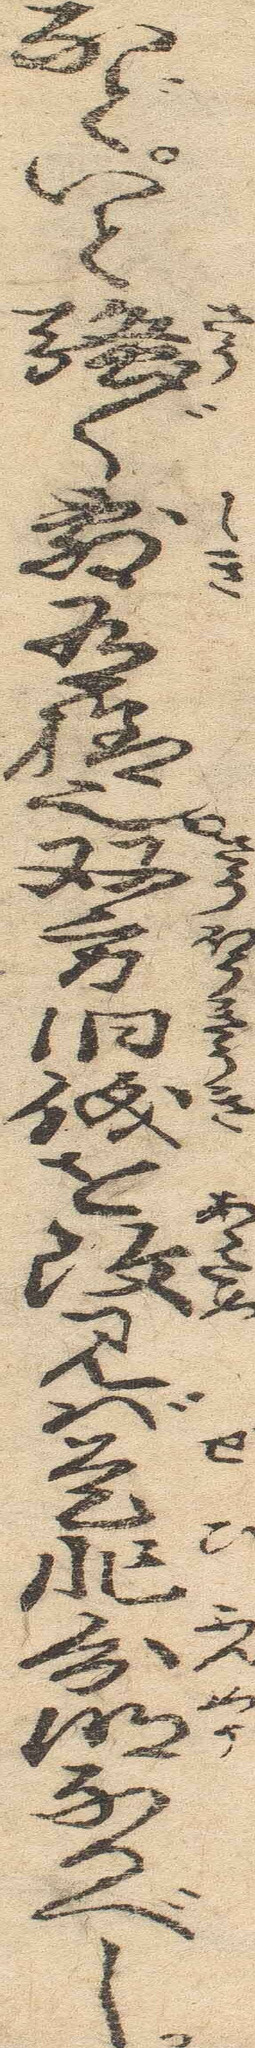など。いと騒〴〵敷有様也。双方旧儀を改見ば是非分明なるべし。
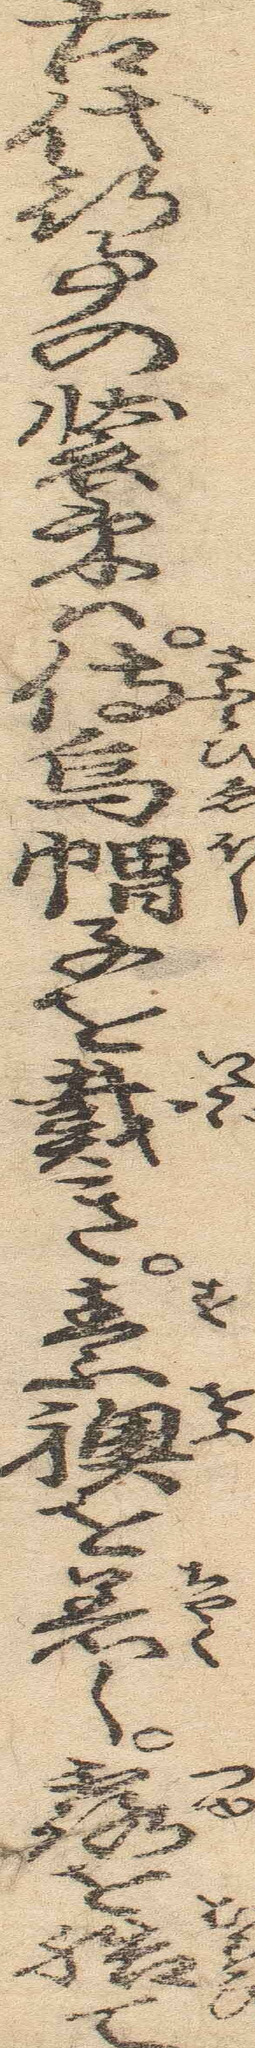古代行事の装束は。侍烏帽子を戴き。素襖を着し。露を結て
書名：古今相撲大全
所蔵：東京学芸大学附属図書館 国文学研究資料館
